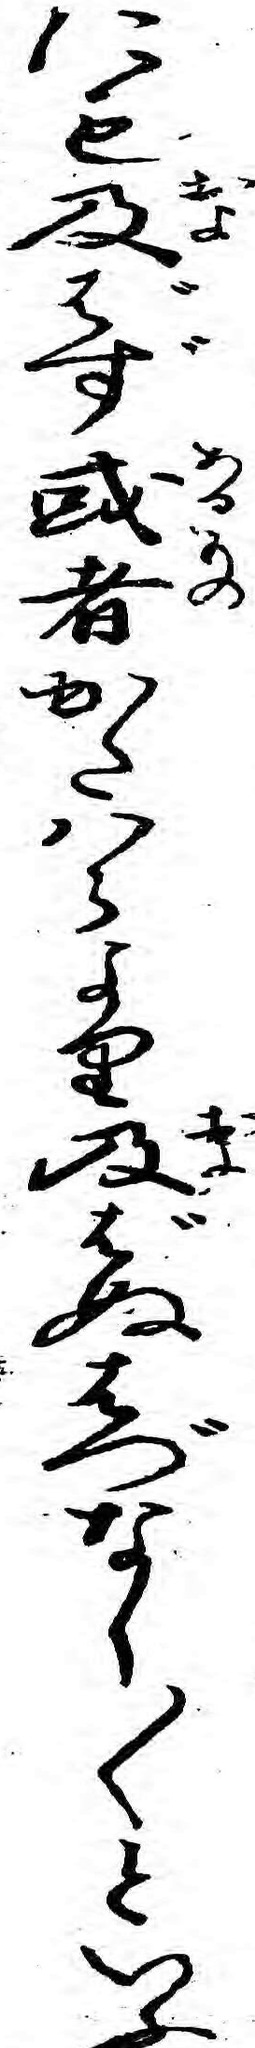にも及ばず或者かたはらより及ばぬはづなし〳〵といふ
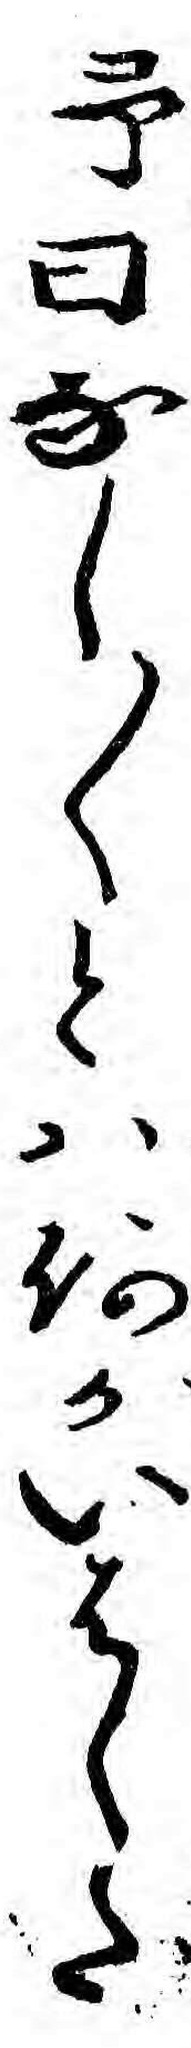予曰なし〳〵とは何がいはくだ
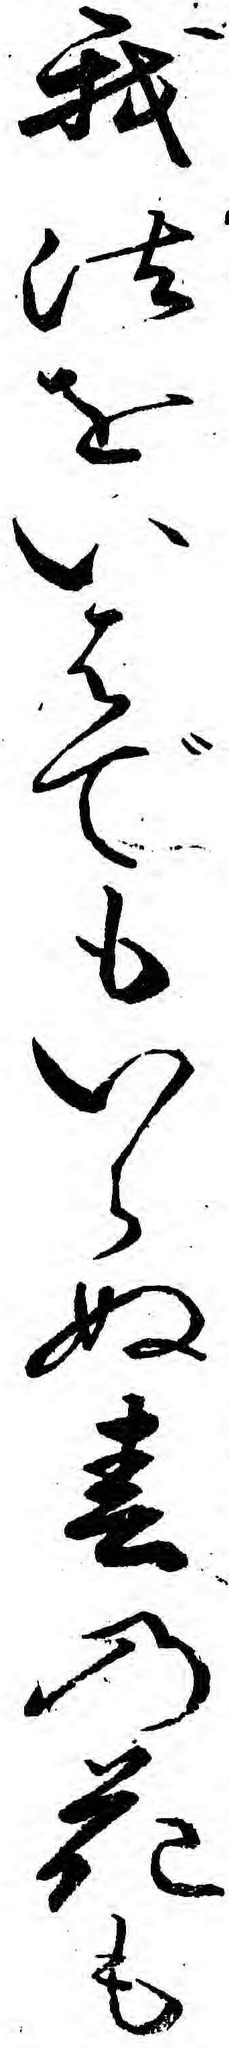我法をいはでもいらぬ春の花も
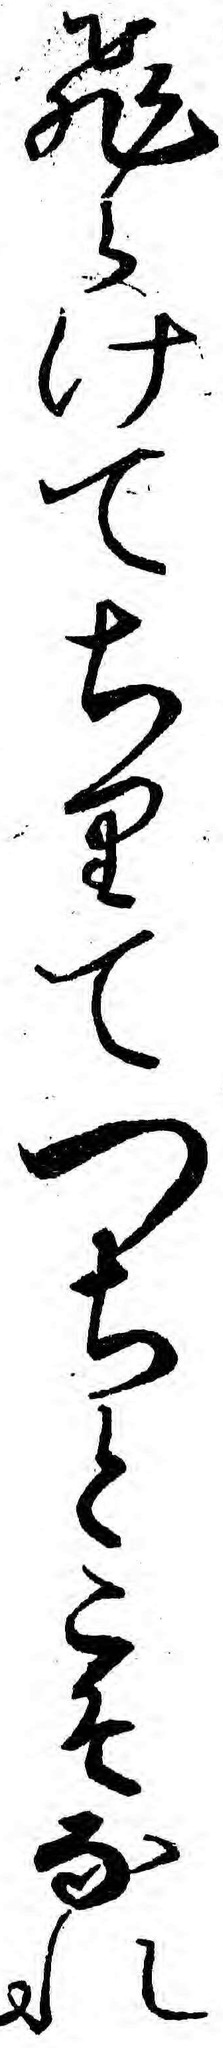飛らけてちりてつちとこそなれ
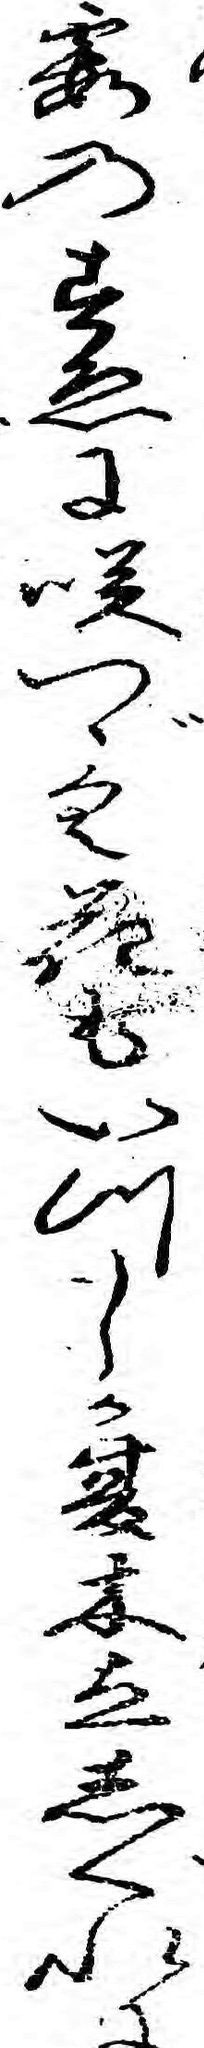霞のすゑに咲つゞく花いつしか夏木立しぐれに
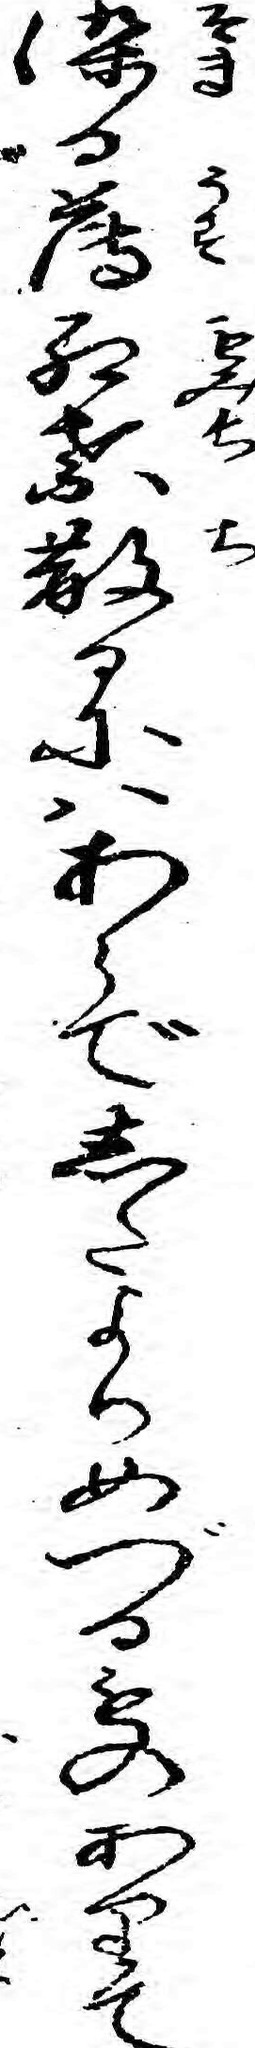染る薄紅葉散るにはあらでしたよりめづるものありて
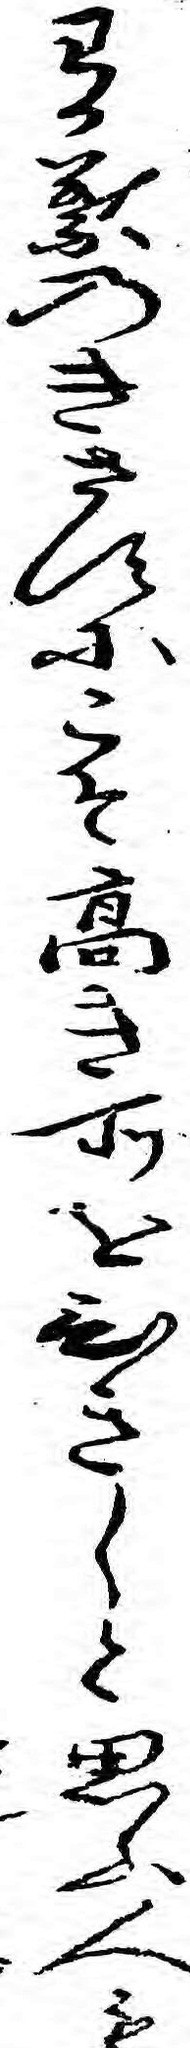わか葉のきさすにこそ高き所をひきしと思ふ人も
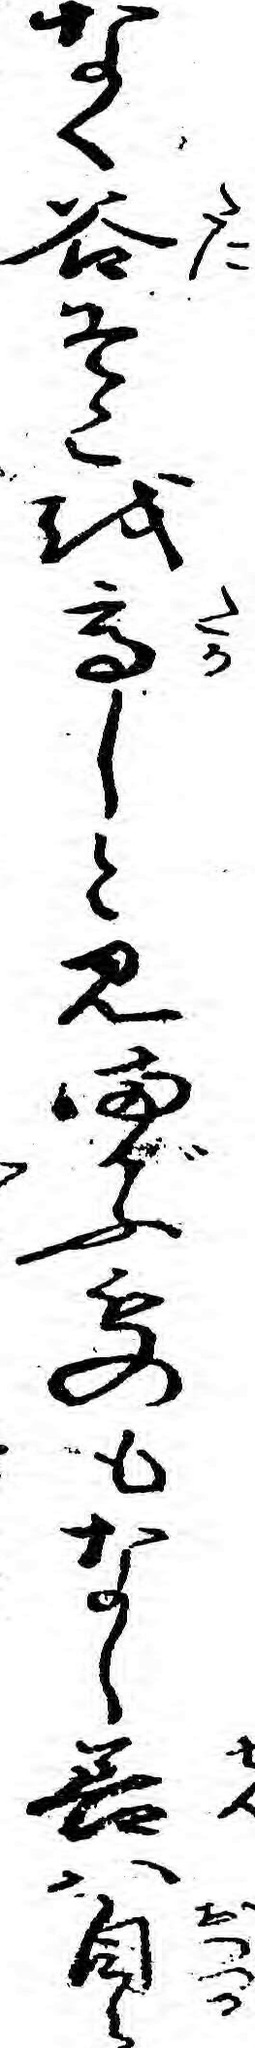なく谷そこを高しと見まがふものもなし善は自ら
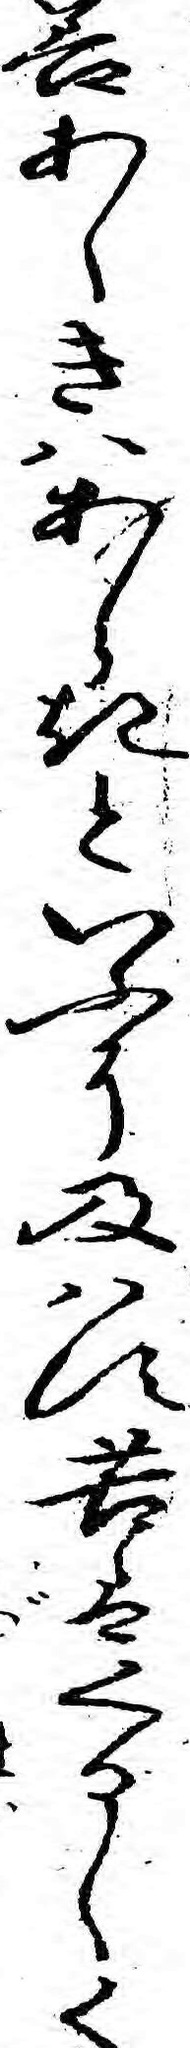善あしきはあしきといふに及はす苦はくるしく
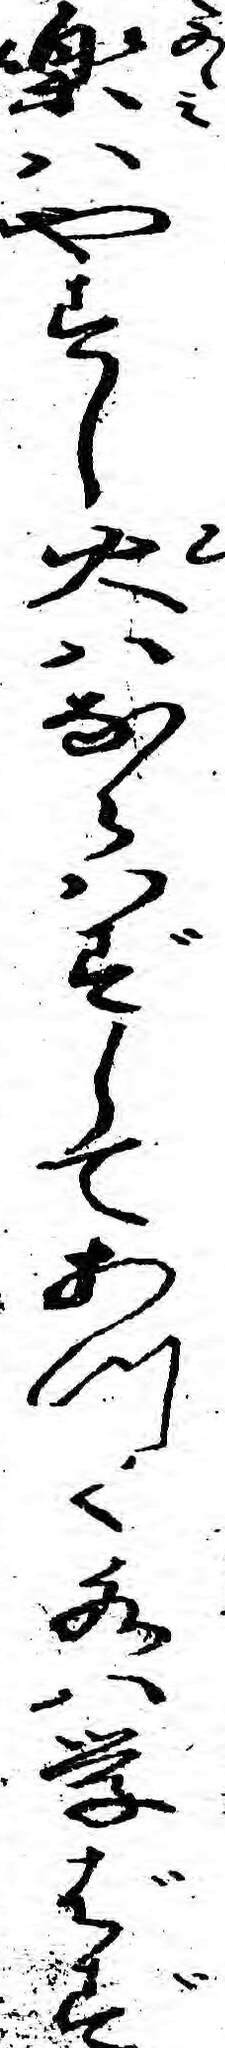楽はやすし火はならはずしてあつく水は学ばず

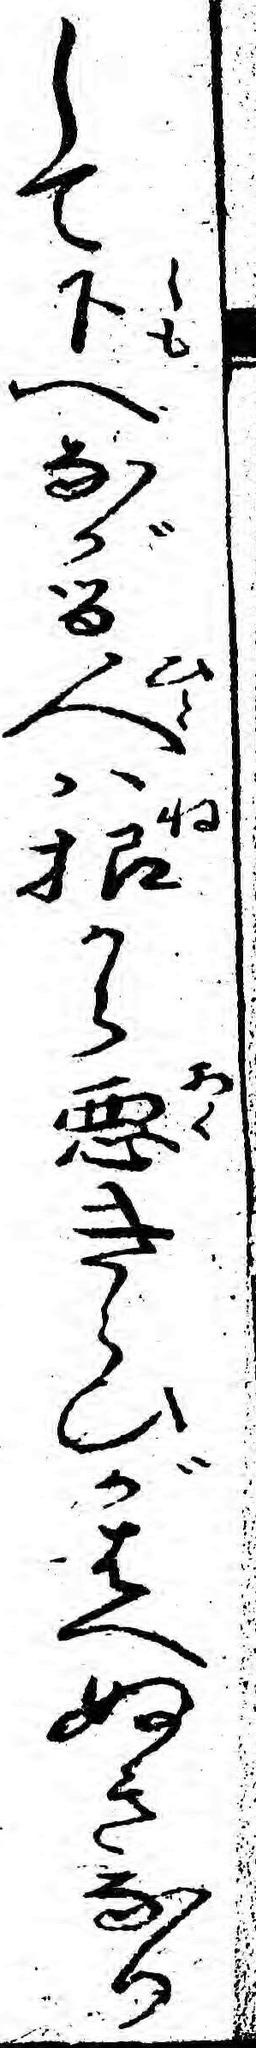して下へながる人は根から悪きらひがはへぬきなり
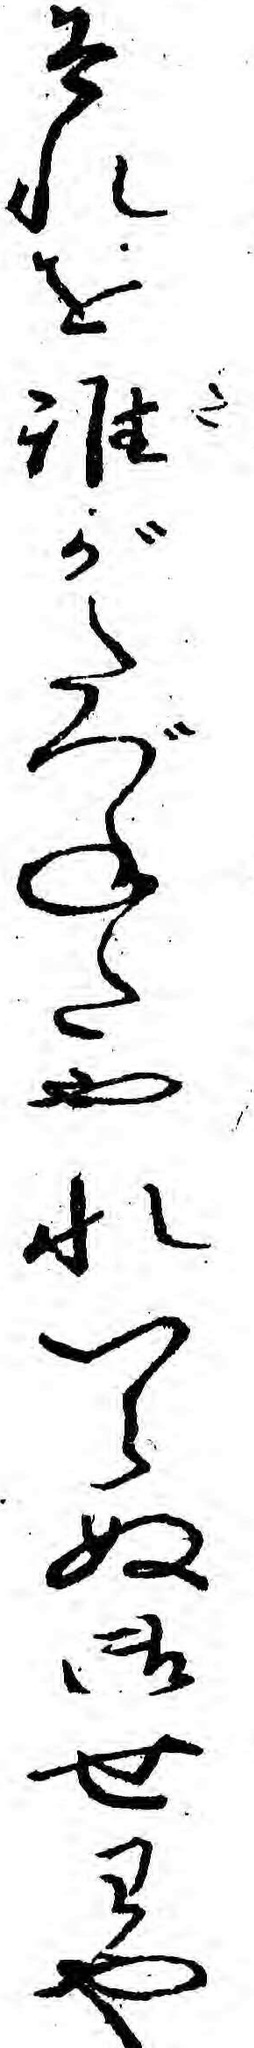それを誰がたづねたやれいらぬ御せわや
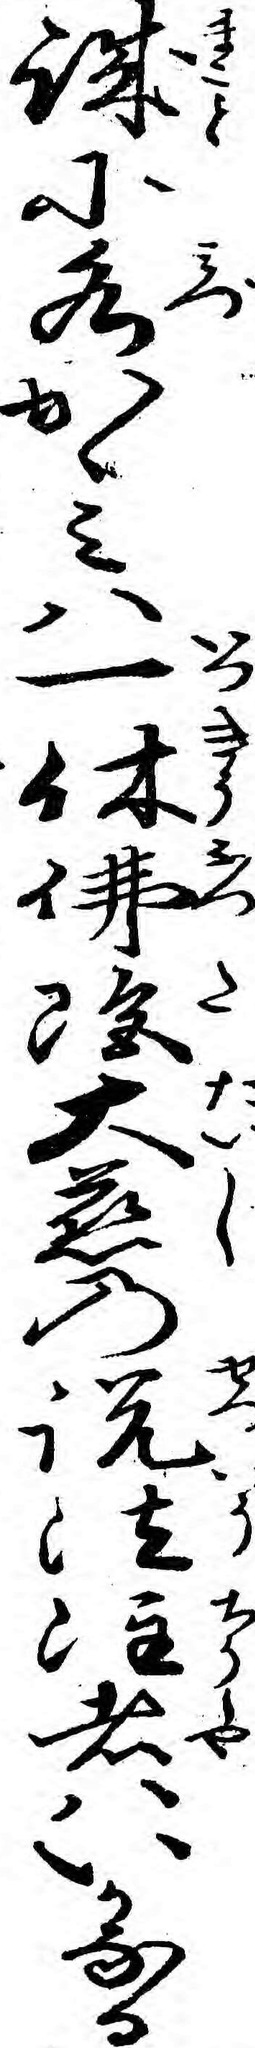誠に水かゝみは一休仏陀大慈の説法注者はいかなる
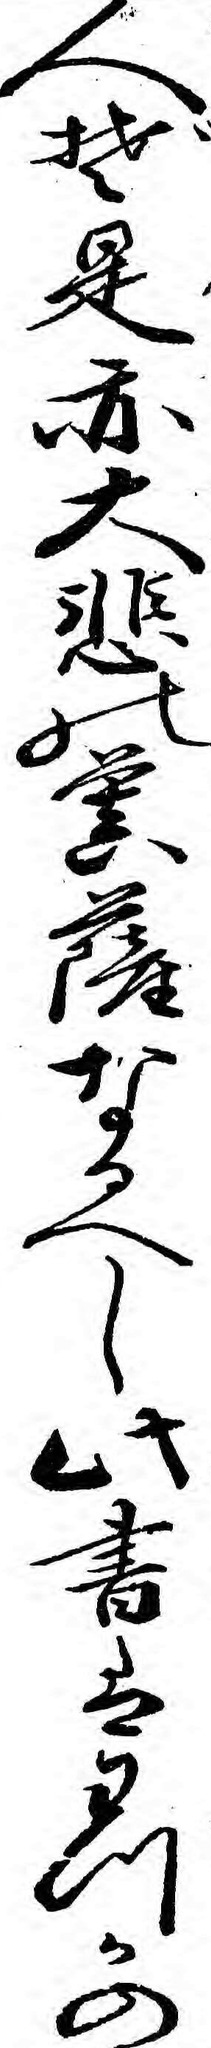人ぞ是亦大悲の菩薩なるへし此書はわづかの
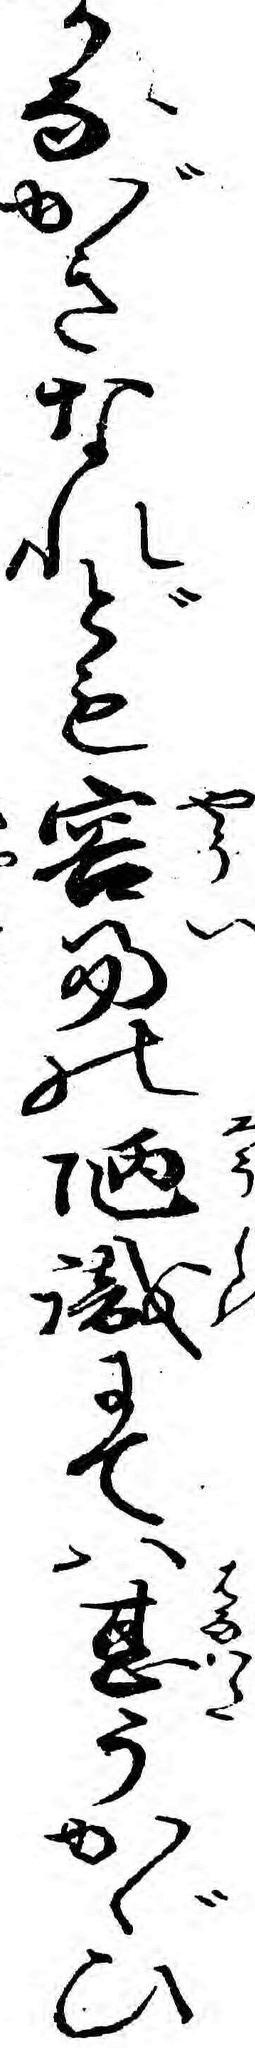かながきなれども容易の陋誠にては甚うかゞひ
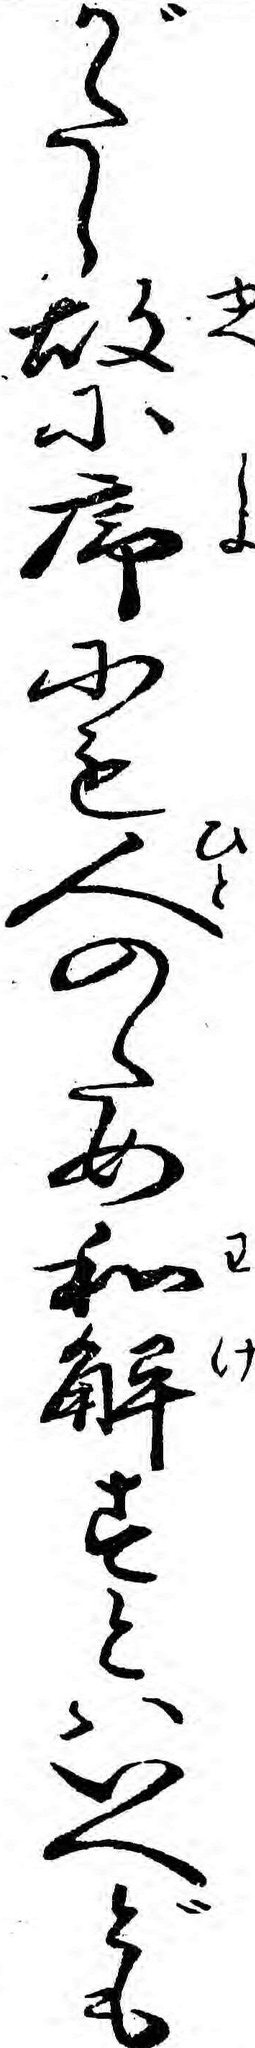がたし故に序にも人のため和解すとはいへども
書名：目なし用心抄
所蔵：国文学研究資料館
